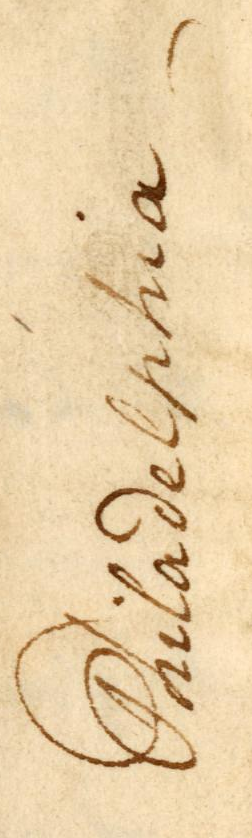Philadelphia
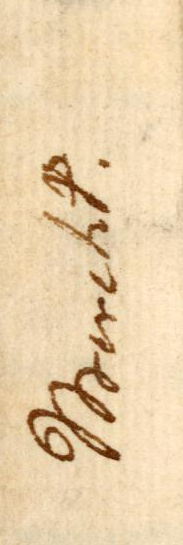merch^t
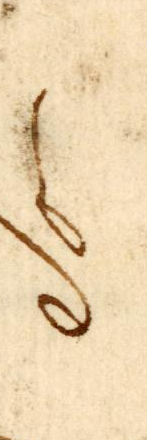To
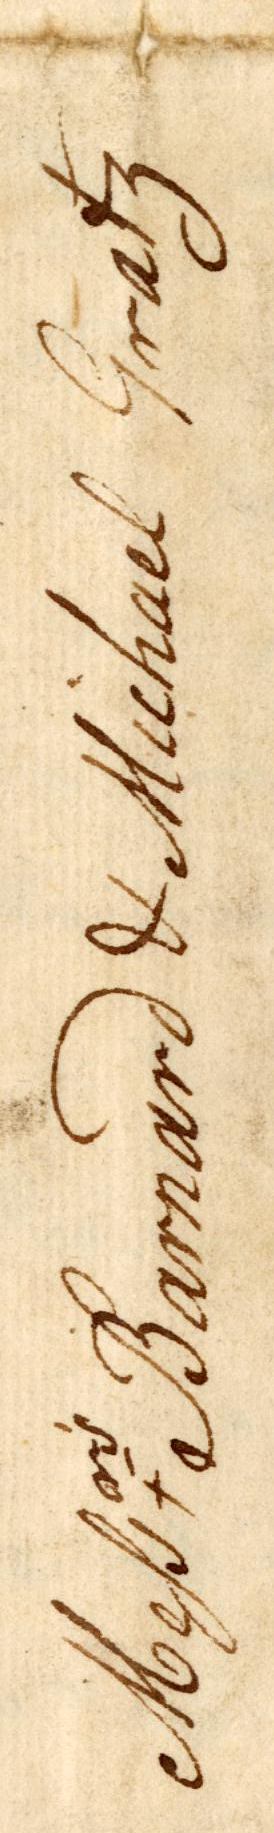Mess^rs Barnard & Michael Gratz
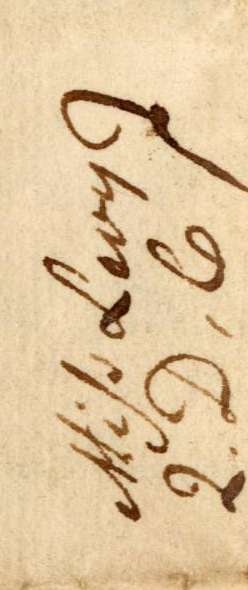Miss Levy
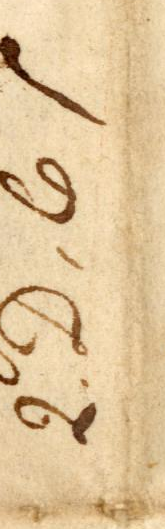2.D.6
